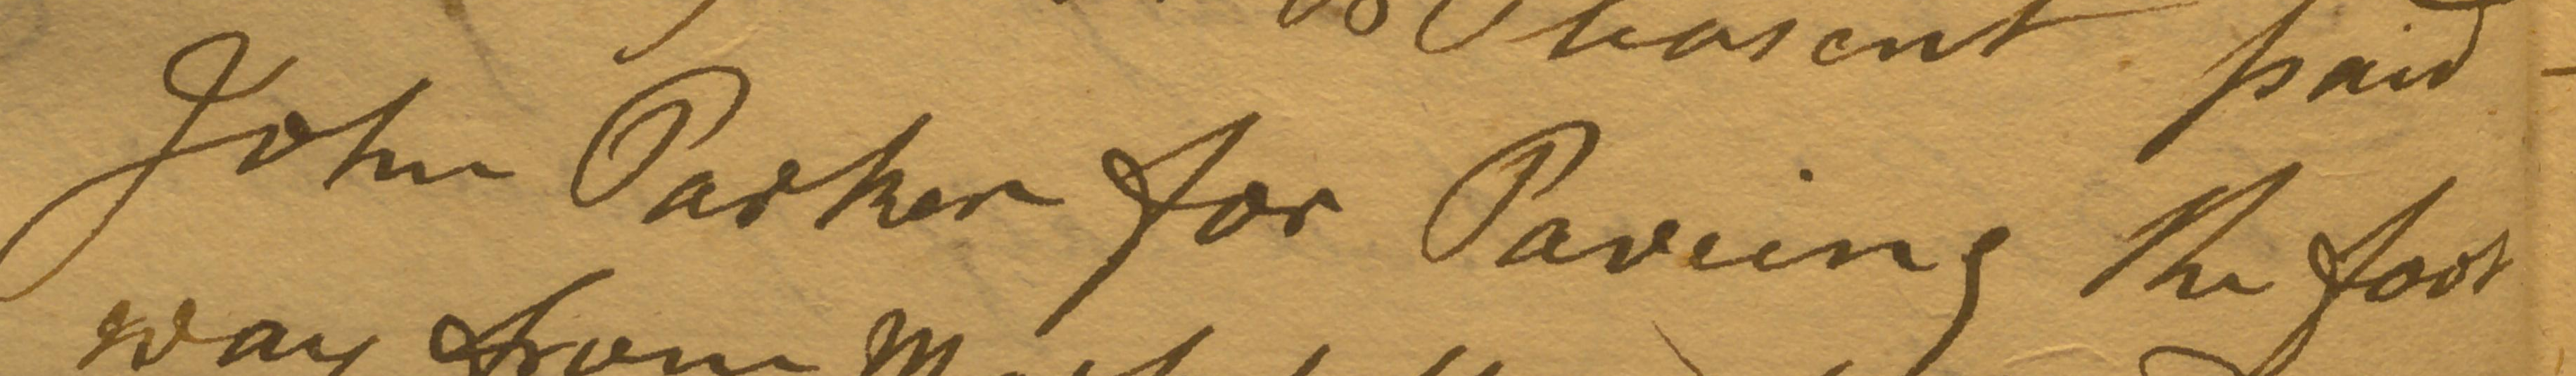John Parker for Paveing the foot
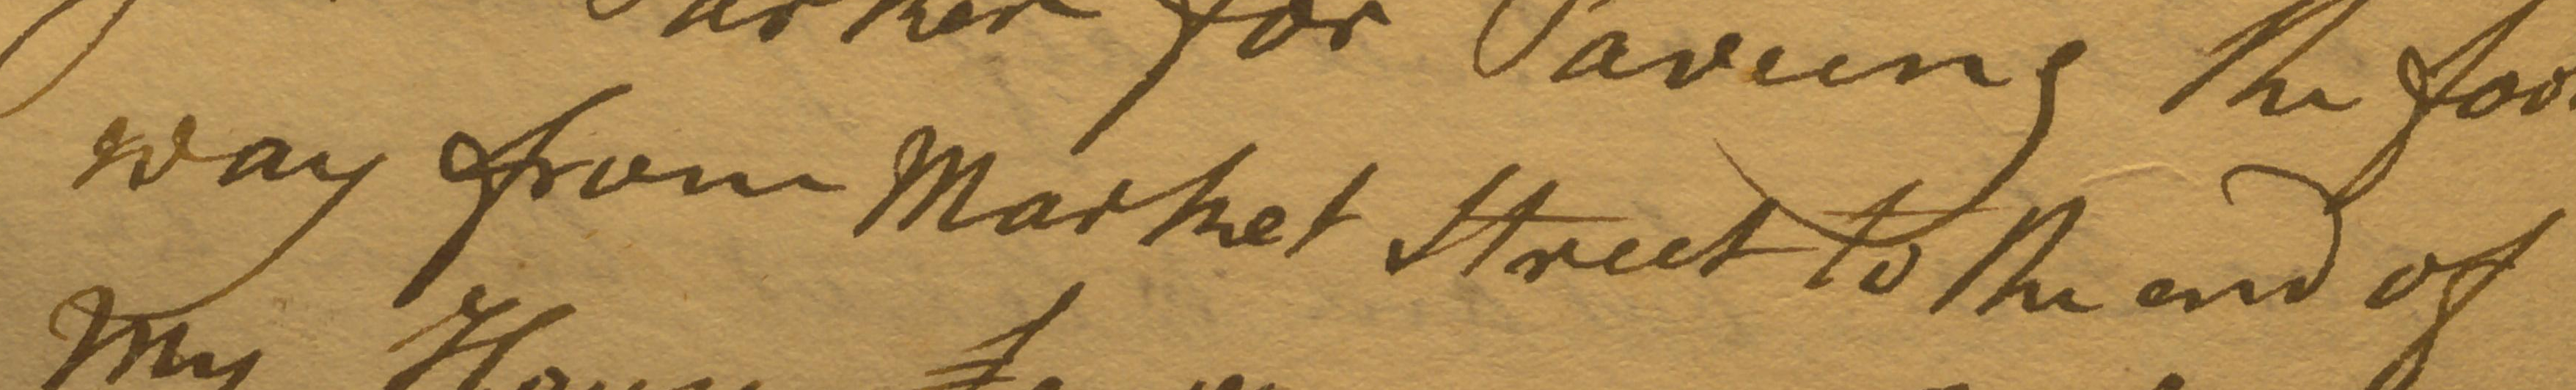way from Market Street to the end of
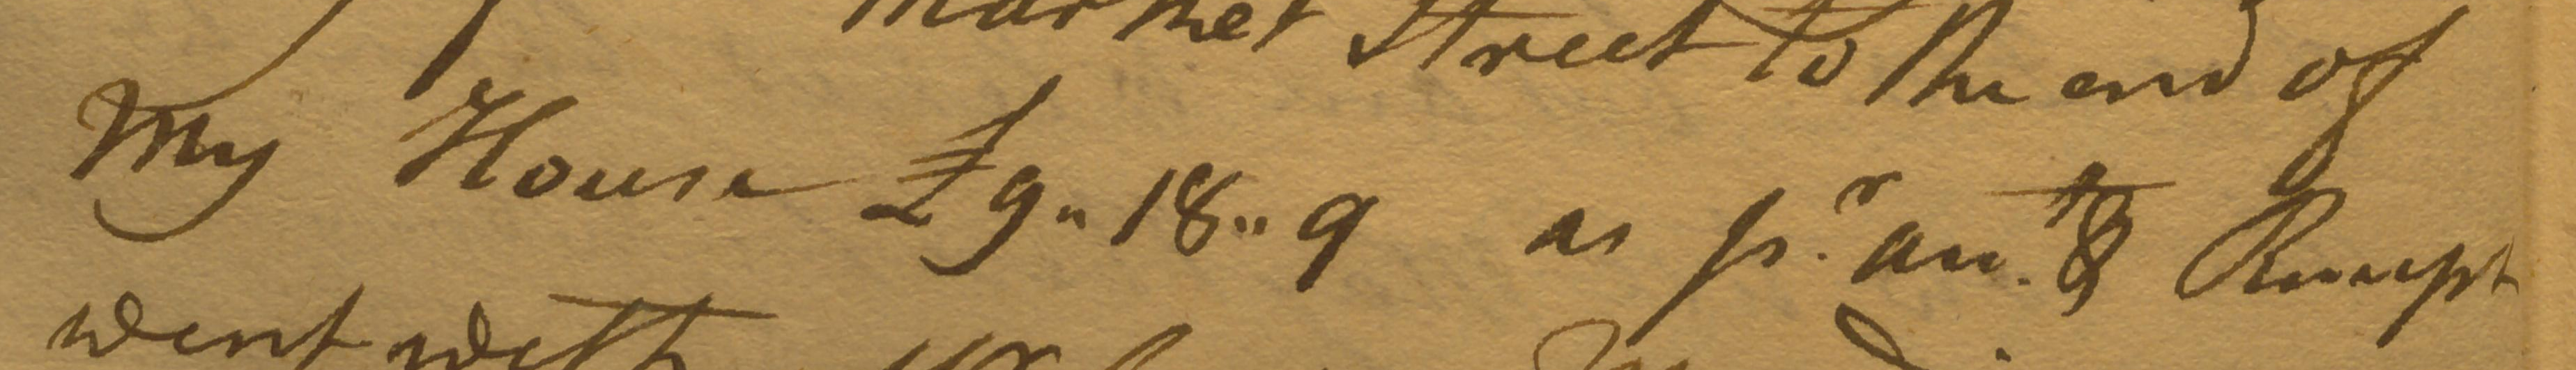My House £9.18.9 as p^r. acc^t. & Receipt
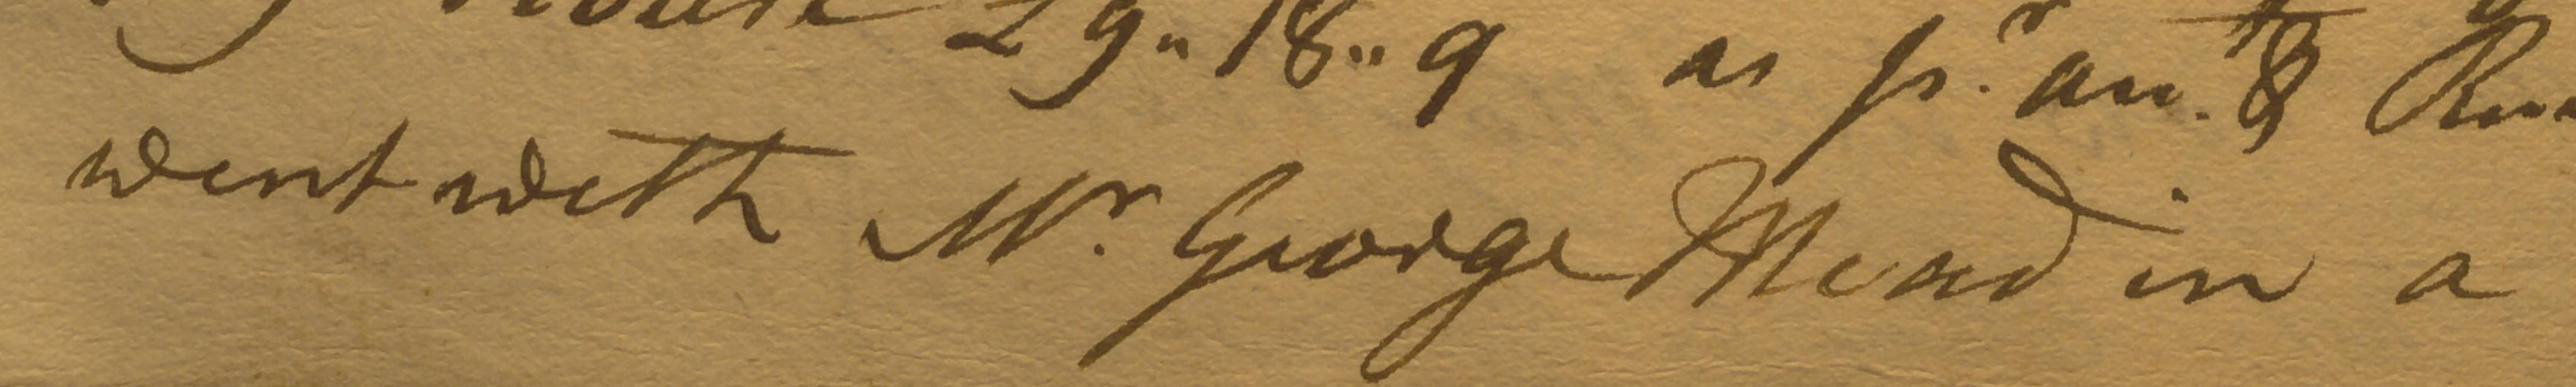went with M^r. George Mead in a
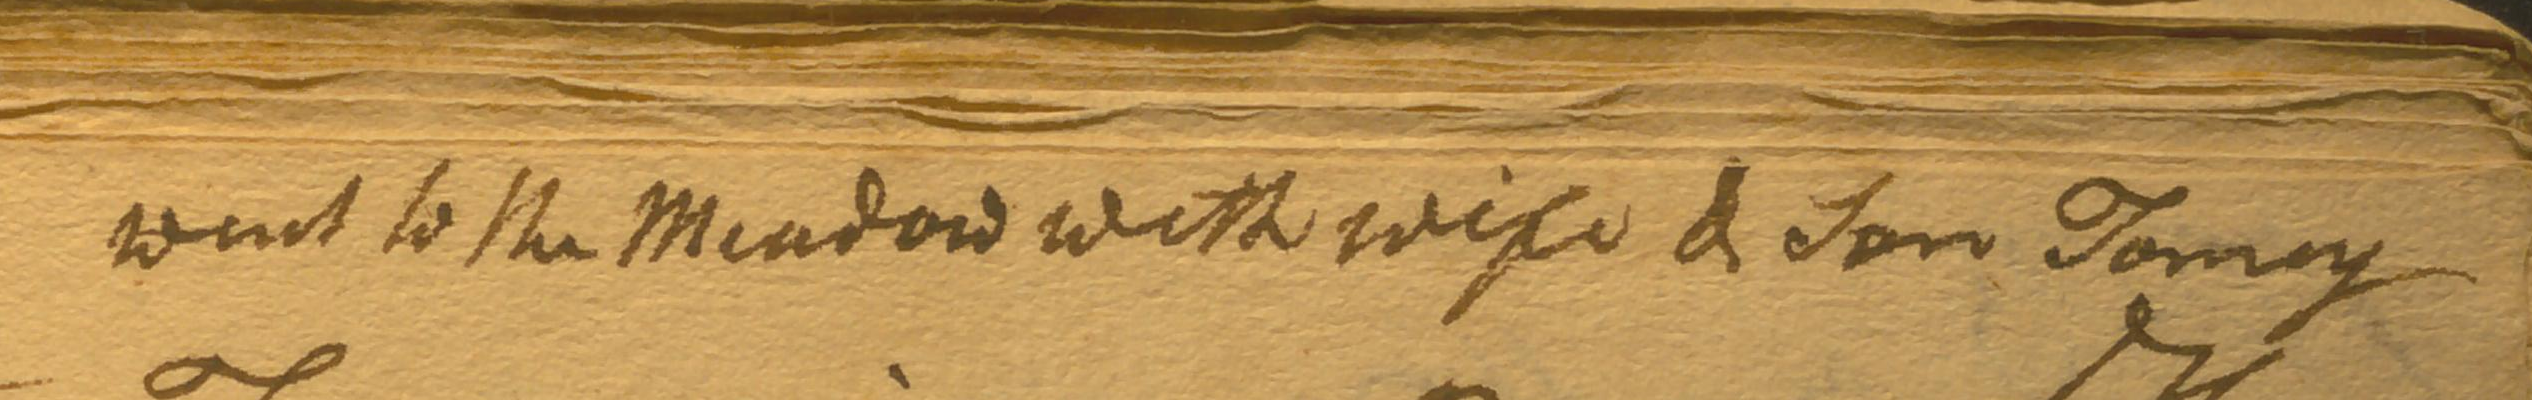went to the Meadow with wife & son Tomey
